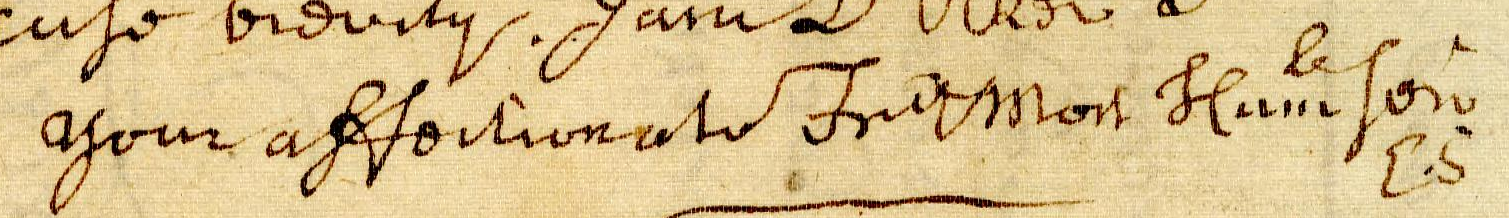Your affectionate Fr^d & Most Hum^bl Serv.^t
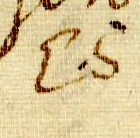E.S
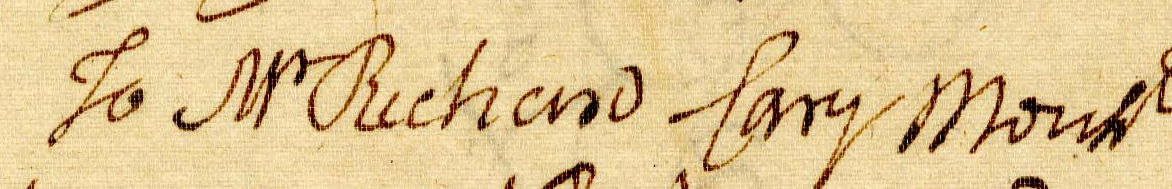To M^r Richard Cary Merch^t
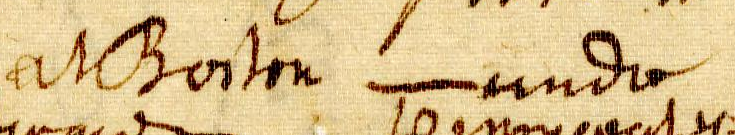at Boston under
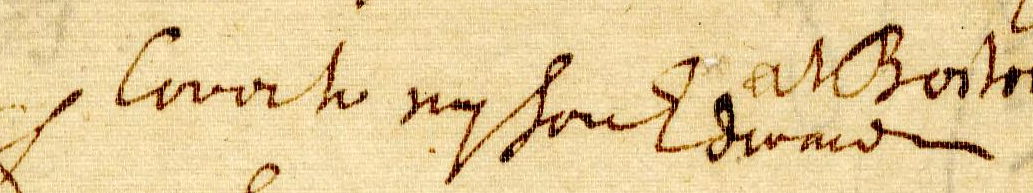Cover to my Son Edward
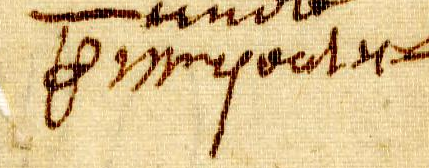per M^r Yeates
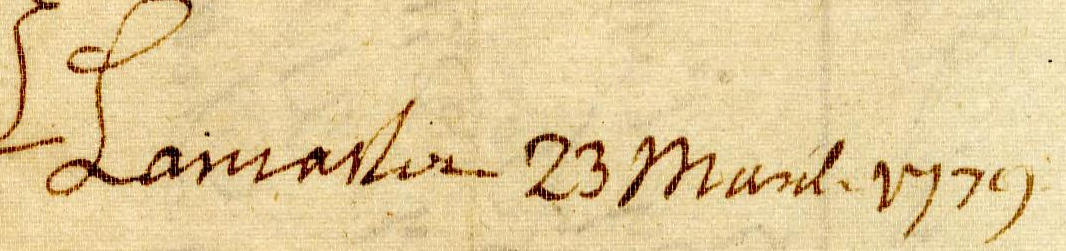Lancaster 23 March 1779
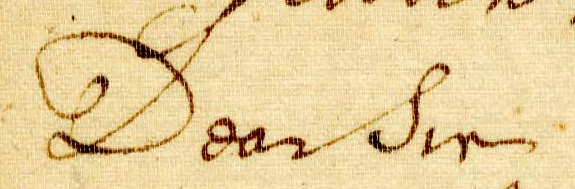Dear Sir
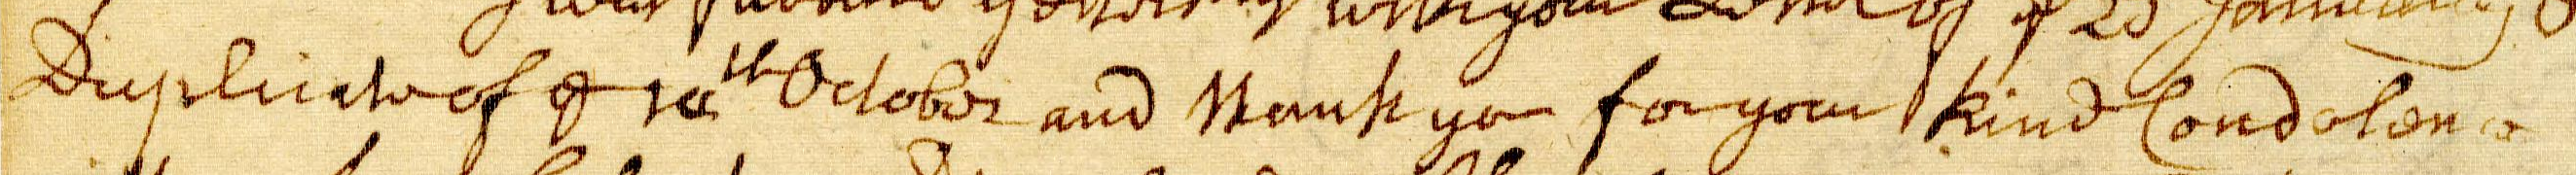Duplicate of y^e 10^th October and thank you for your kind Condolence
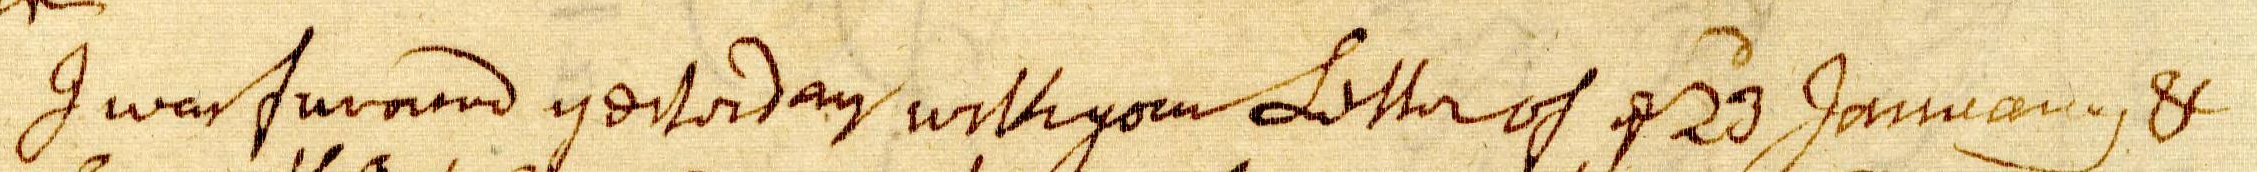I was favoured yesterday with your Letter of y^e 23^d January &
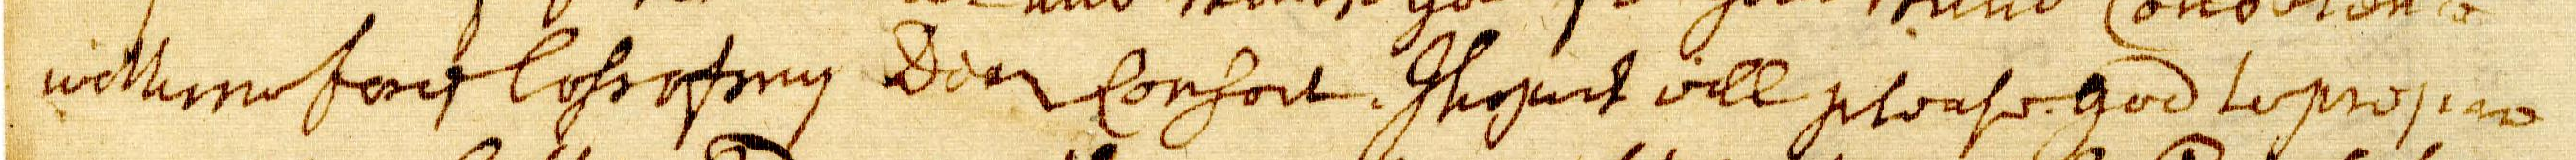with me for y^e loss of my Dear Confort. I hope it will please god to prepare
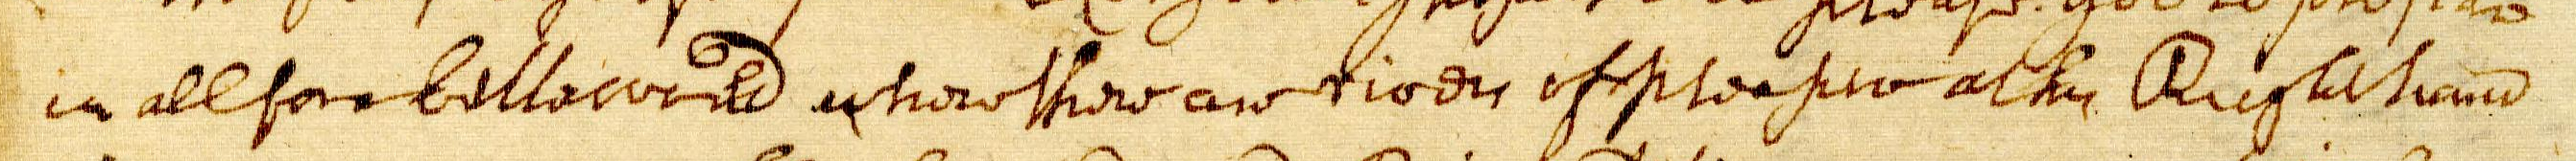us all for a better world where there are rivers of pleasure at the Right hand
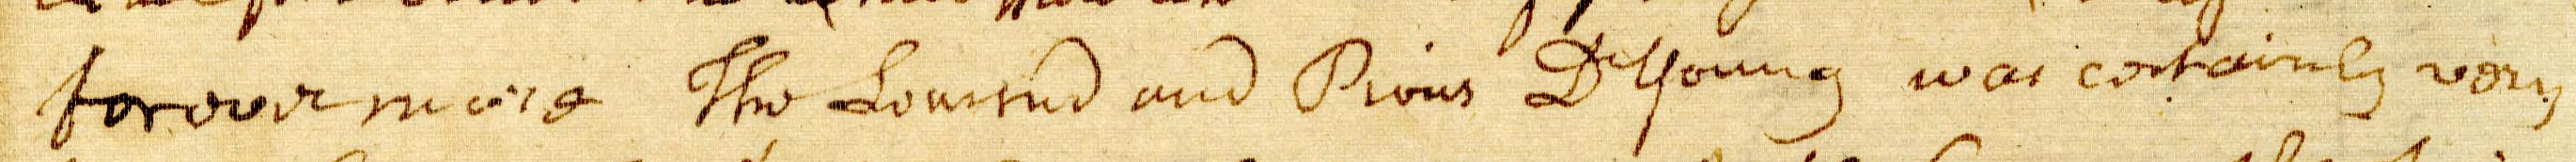forever more The Learned and Pious D^r Young was certainly very
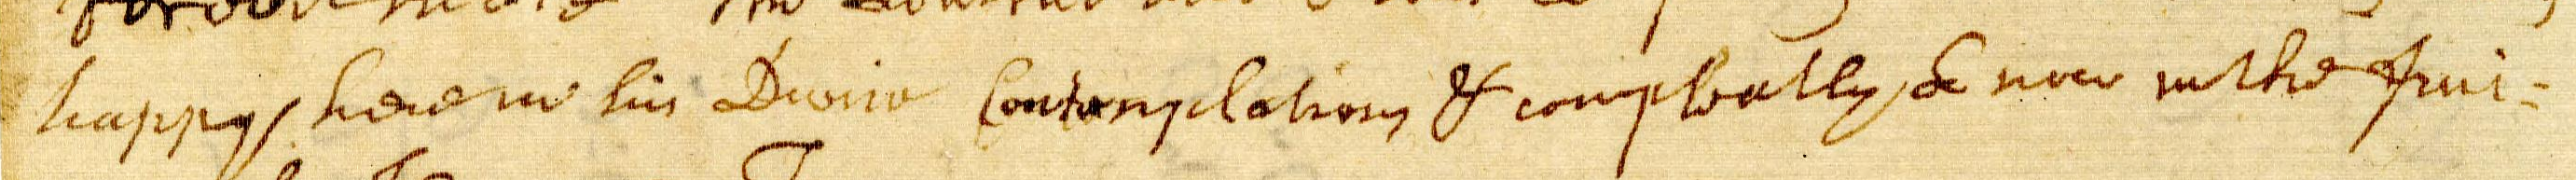happy here in his Divine Contemplations & compleatly & now in the frui-
